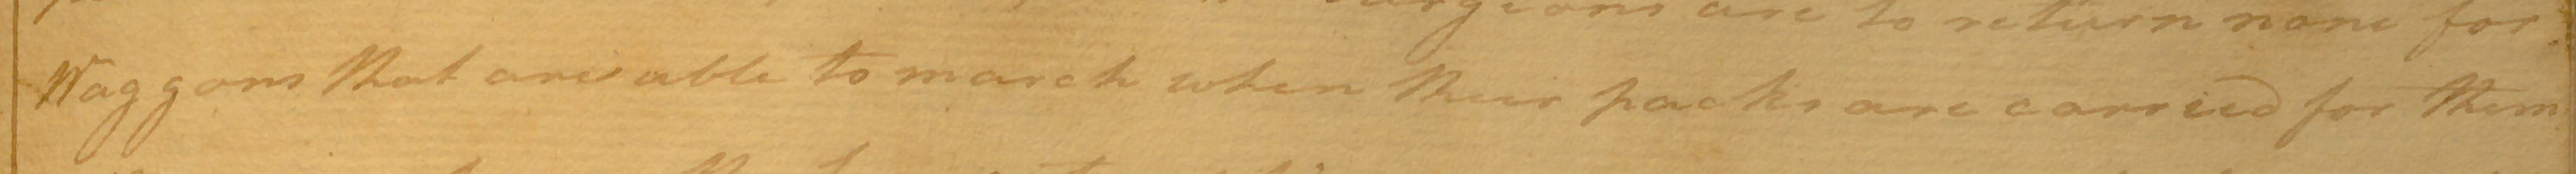Waggons that are able to march when their packs are carried for them
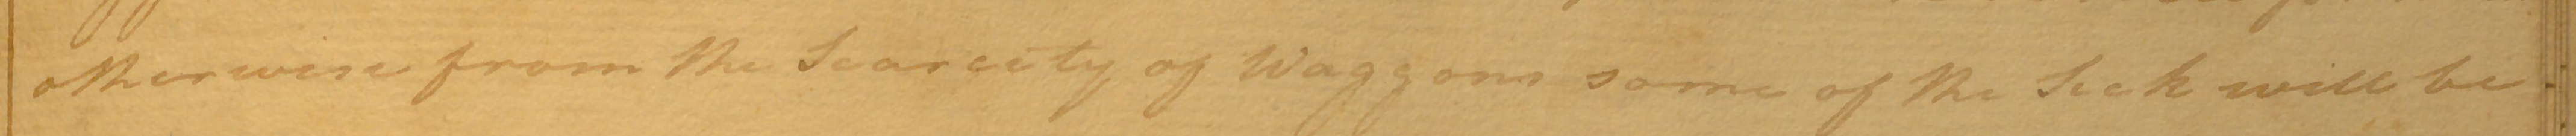otherwise from the Scarcity of Waggons some of the sick will be
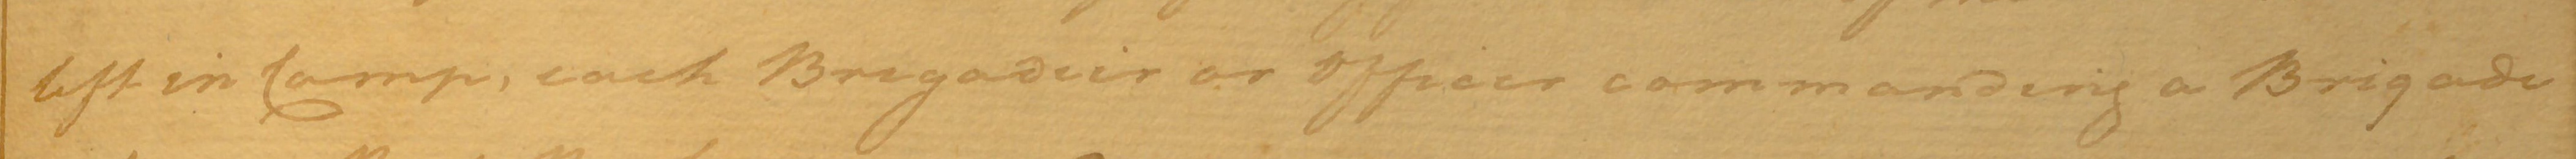left in Camp, each Brigadier or Officer commanding a Brigade
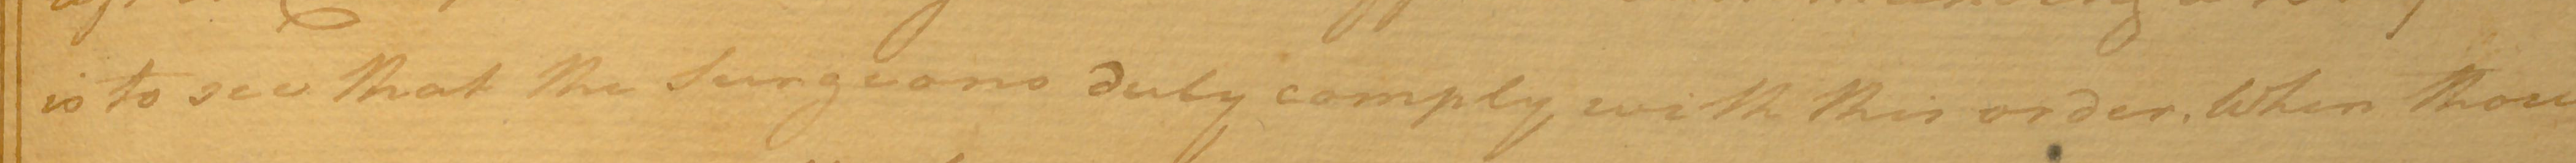is to see that the Surgeons duly comply with this order. When those
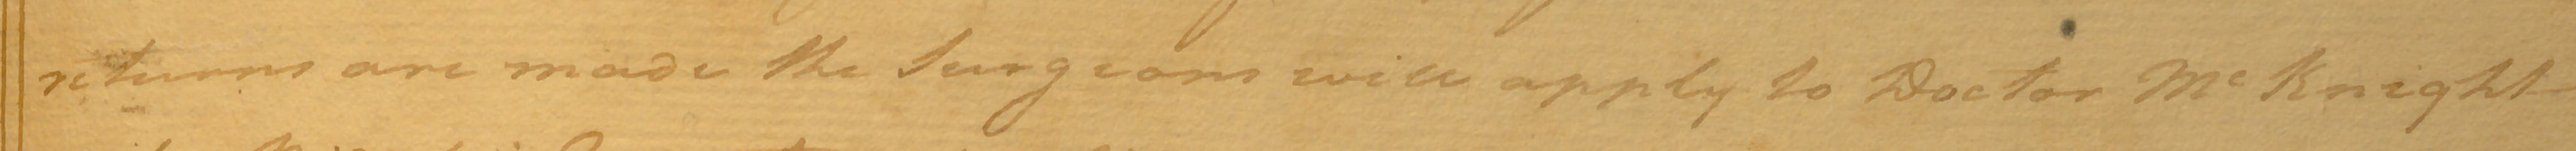returns are made the Surgeons will apply to Doctor M^cKnight
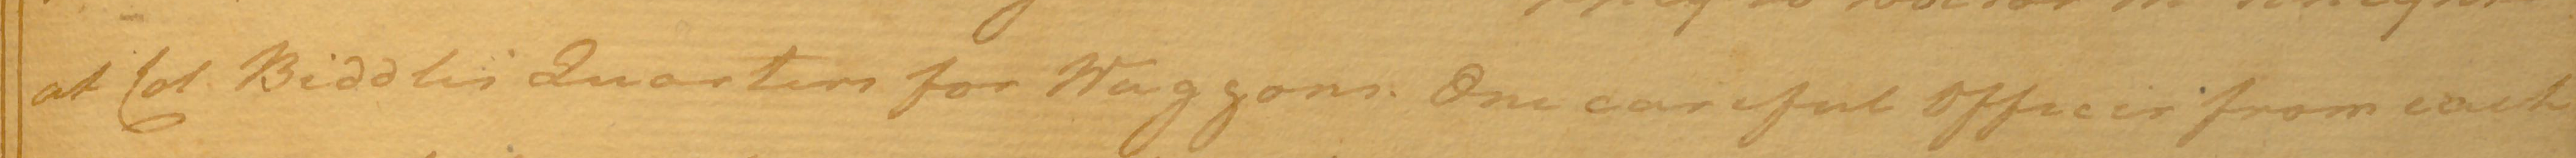at Col Biddles Quarters for Waggons. One careful Officer from each
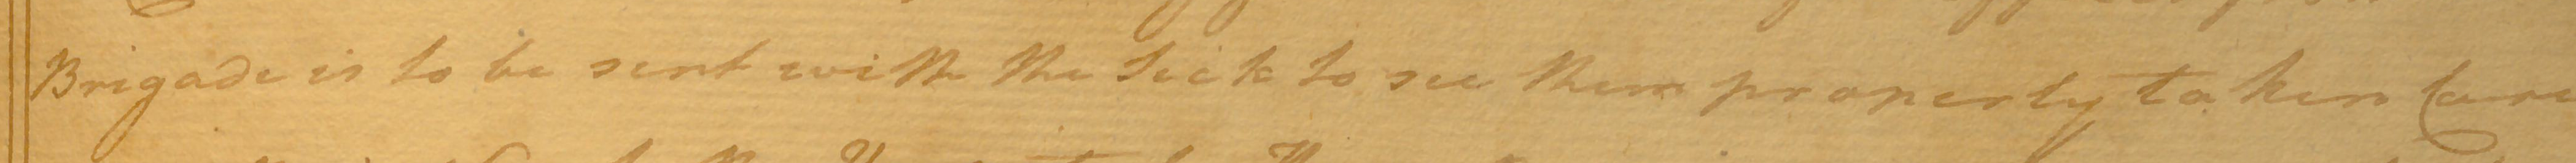Brigade is to be sent with the Sick to see them properly taken care
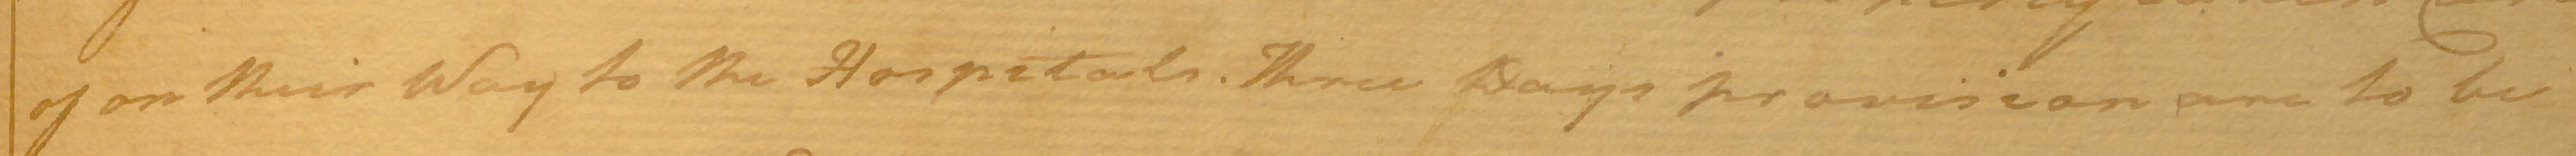of on their Way to the Hospitals. Three Days provision are to be
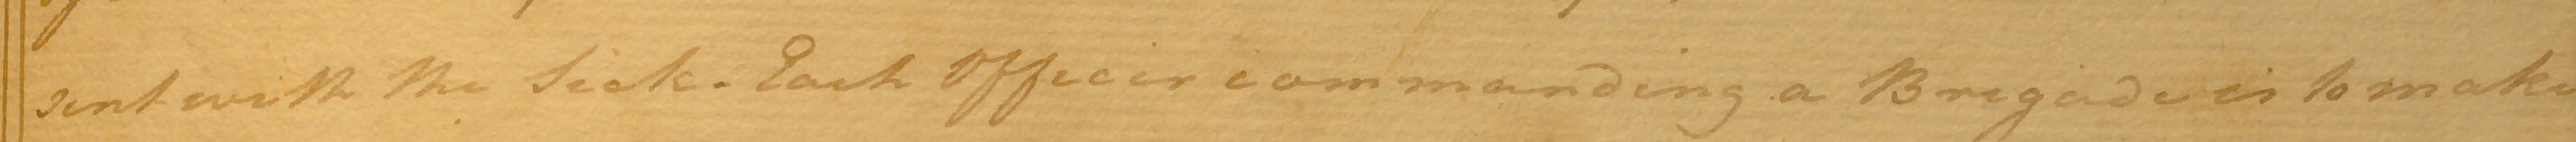sent with the Sick. Each Officer commanding a Brigade is to make
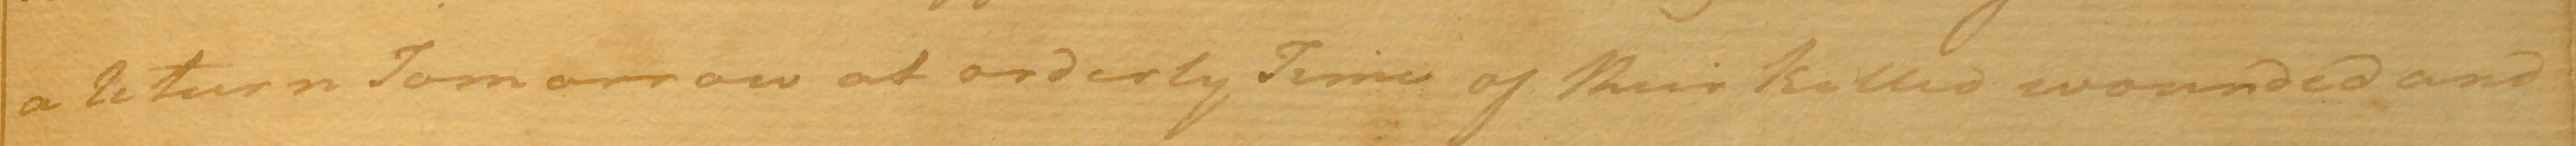a return Tomorrow at orderly Time of their killed wounded and
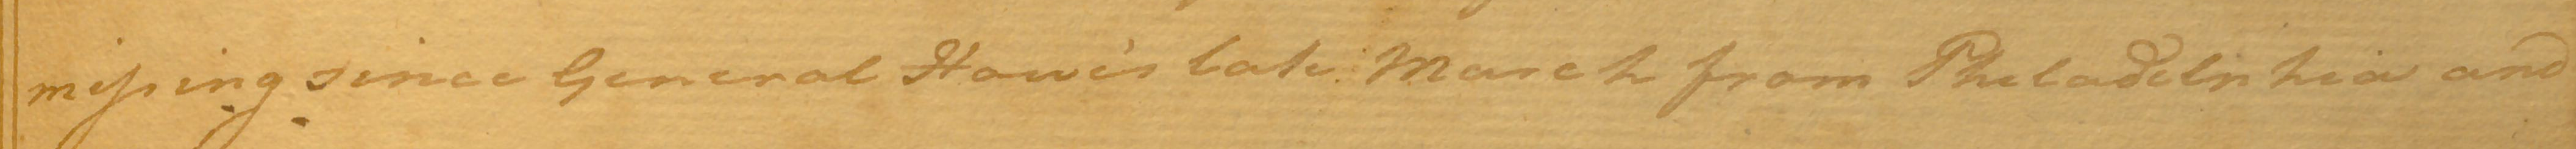missing since General Howe's late March from Philadelphia and
